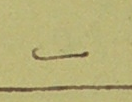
-
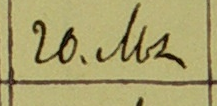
20. Mr.
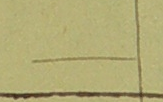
-
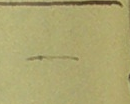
-
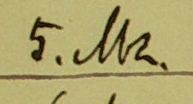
5. Mr.
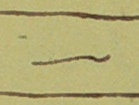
-
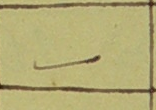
-
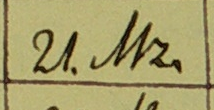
21. Mr.
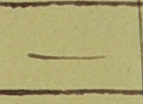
-
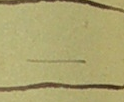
-
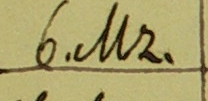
6. Mr.
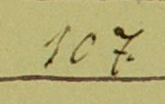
197
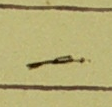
-
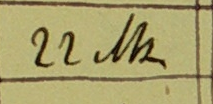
22. Mr.
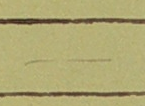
-
